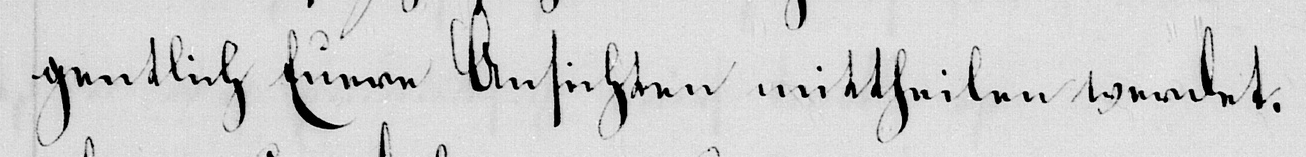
gentlich Eure Ansichten mittheilen werdet.
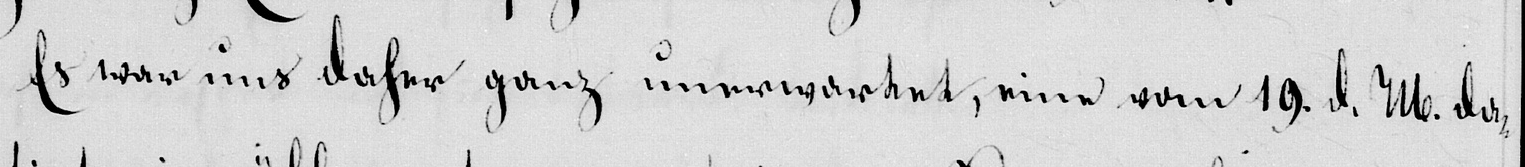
Es war uns daher ganz unerwartet, eine vom 19. d. M. da¬
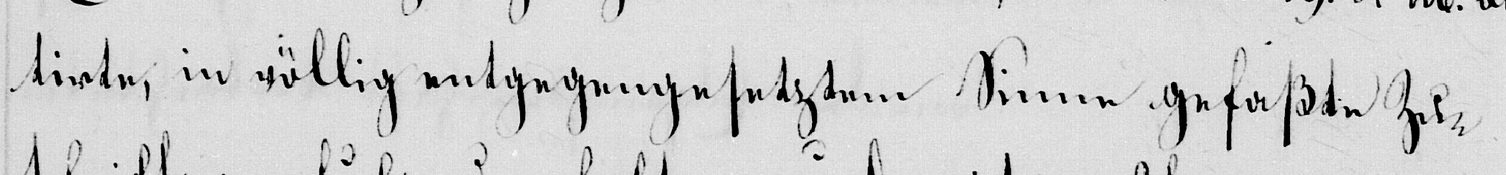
tirte, in völlig entegegengesetztem Sinne gefaßte Zu¬
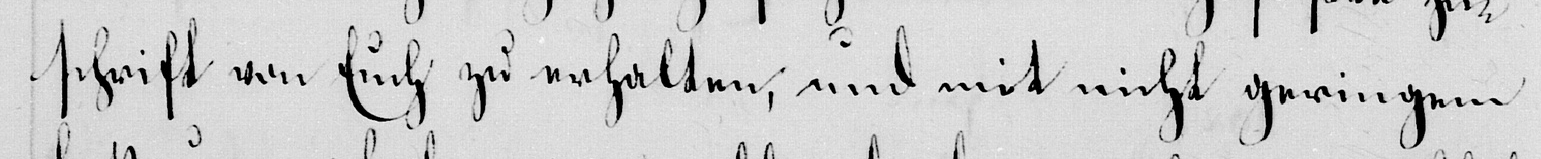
schrift von Euch zu erhalten, und mit nicht geringem
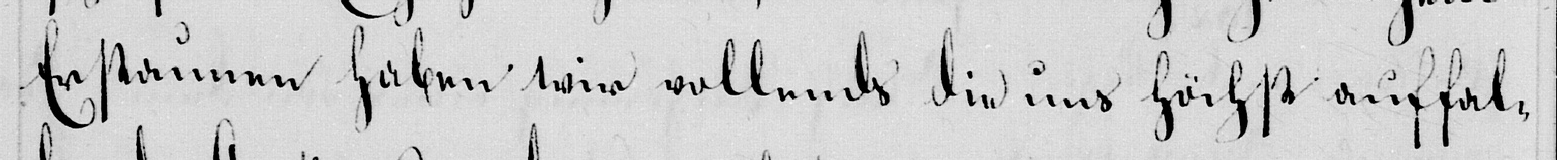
Erstaunen haben wir vollends die uns höchst auffal¬
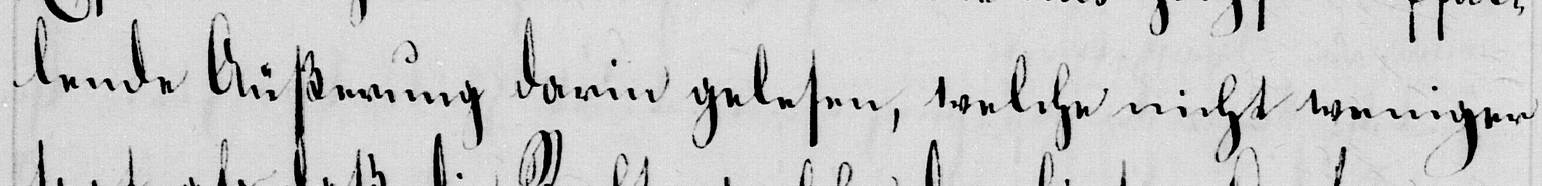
lende Äußerung darin gelesen, welche nicht weniger
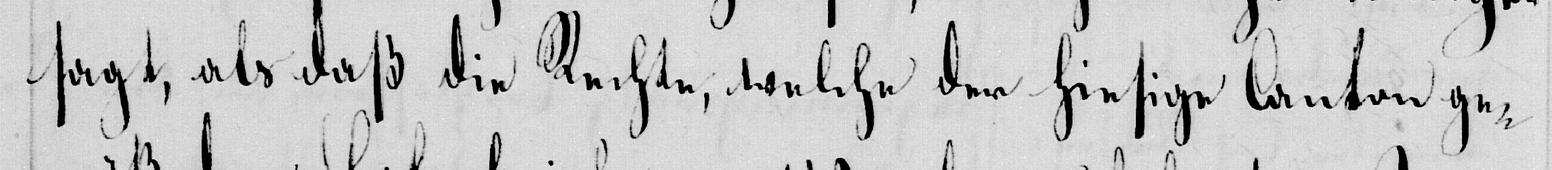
sagt, als daß die Rechte, welche der hiesige Canton ge¬
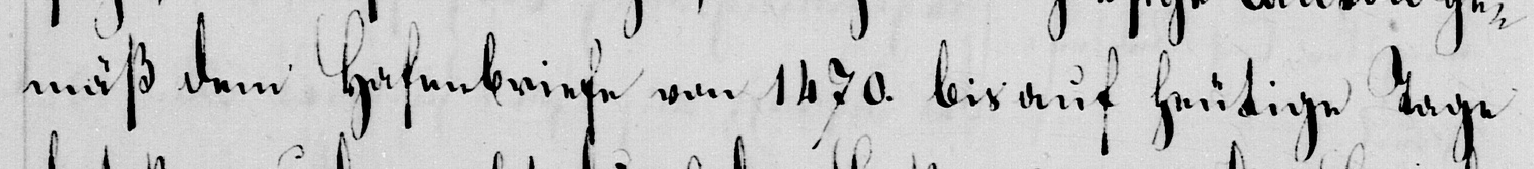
mäß dem Hafenbriefe von 1470. bis auf heutigen Tage
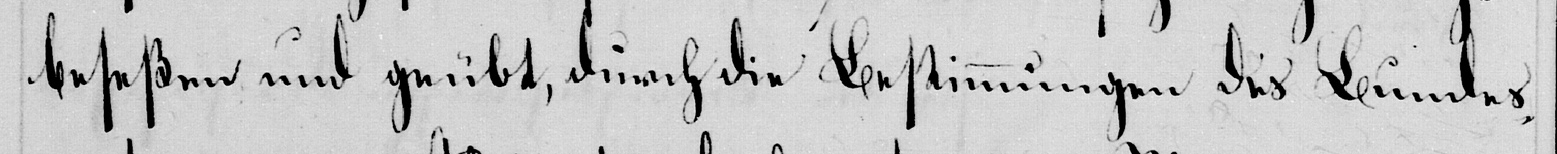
beseßen und geübt, durch die Bestimmungen des Bundes¬
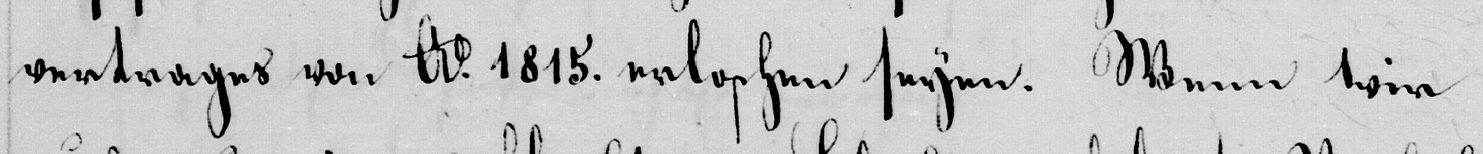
vertrages von Ao. 1815. verloschen seyen. Wenn wir
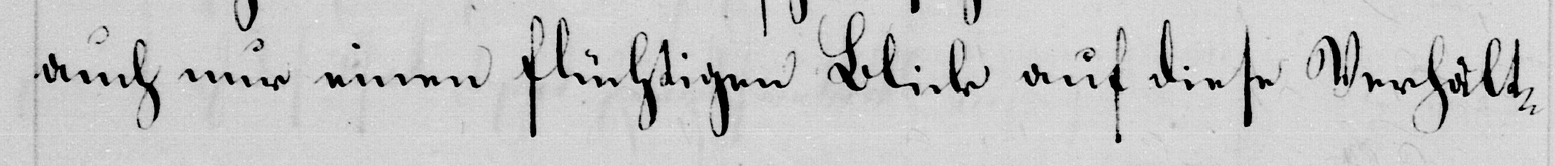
auch nur einen flüchtigen Blick auf diese Verhält-
